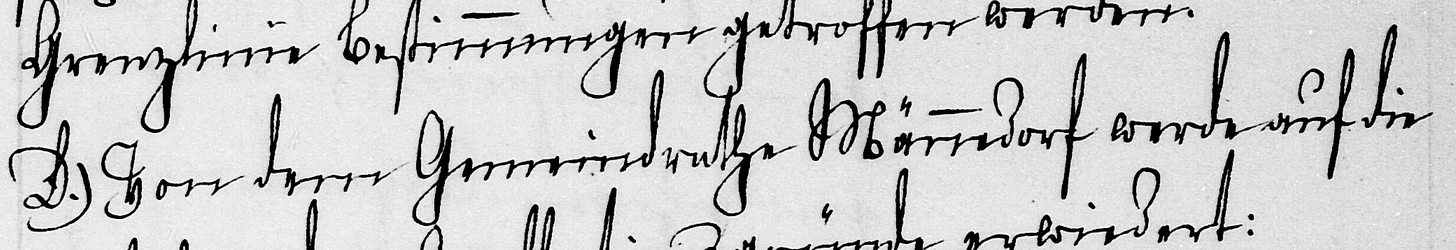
D.) Von dem Gemeindrathe Männedorf werde auf die
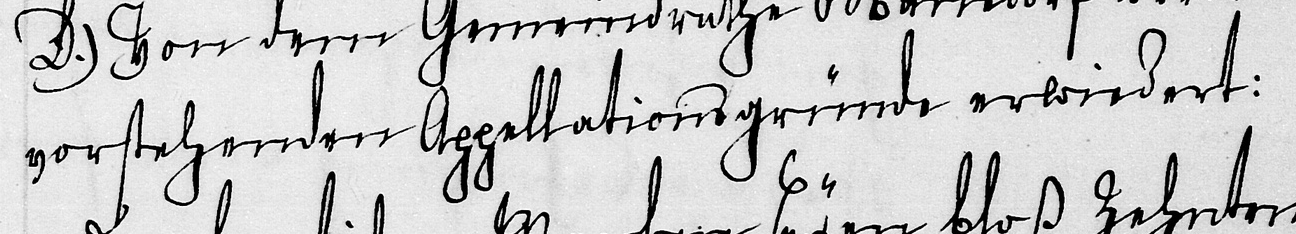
vorstehenden Appellationsgründe erwiedert:
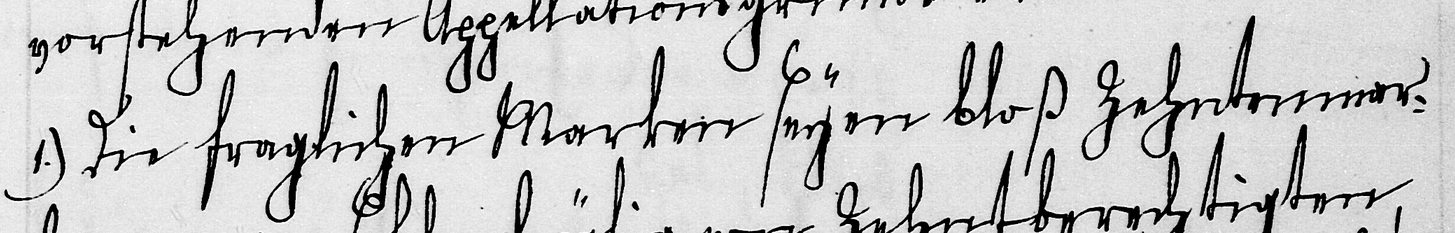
1.) Die fraglichen Marken seyen bloß Zehntenmar¬
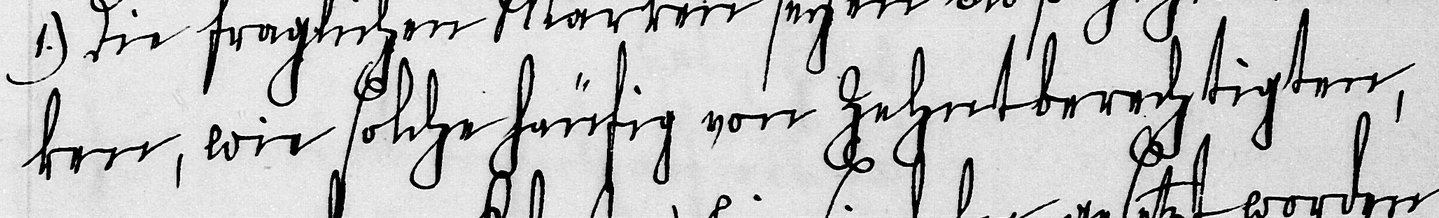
ken, wie solche häufig von Zehntberechtigten,
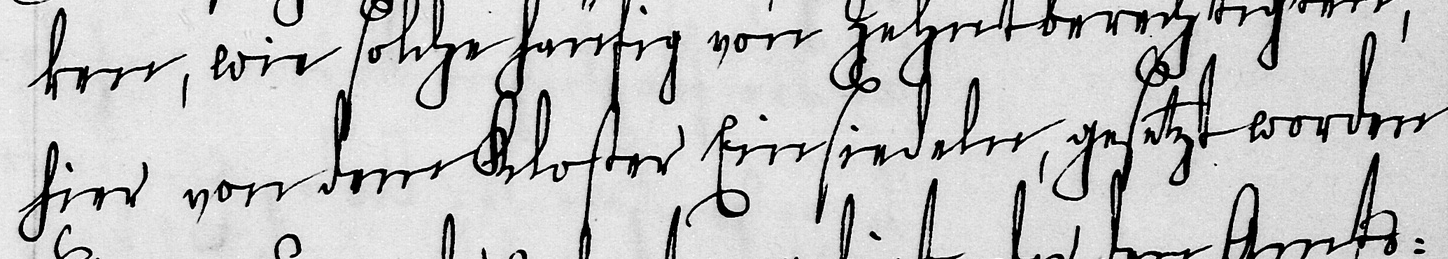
hier von dem Kloster Einsiedeln, gesetzt worden
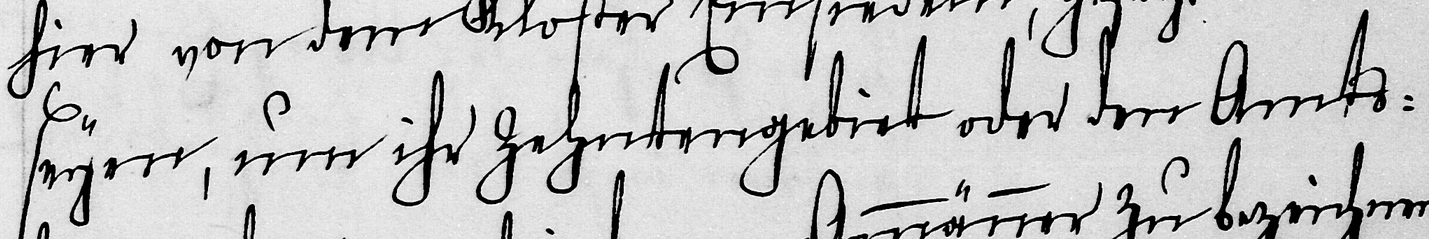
seyen, um ihr Zehntengebiet oder den Amts¬
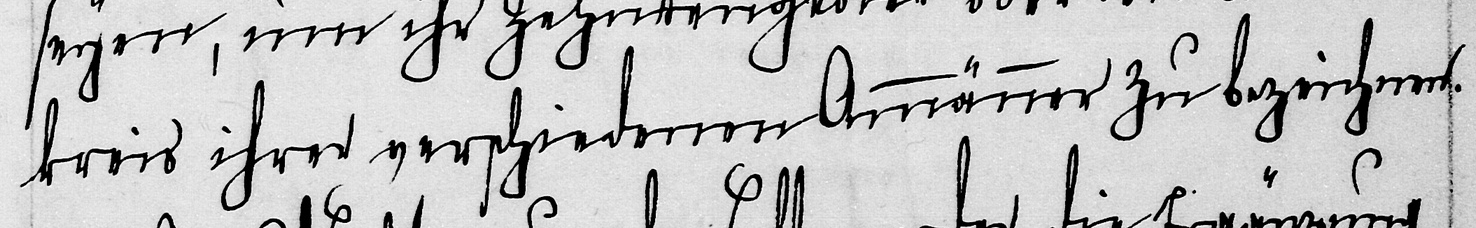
kreis ihrer verschiedenen Ammänner zu bezeichnen.
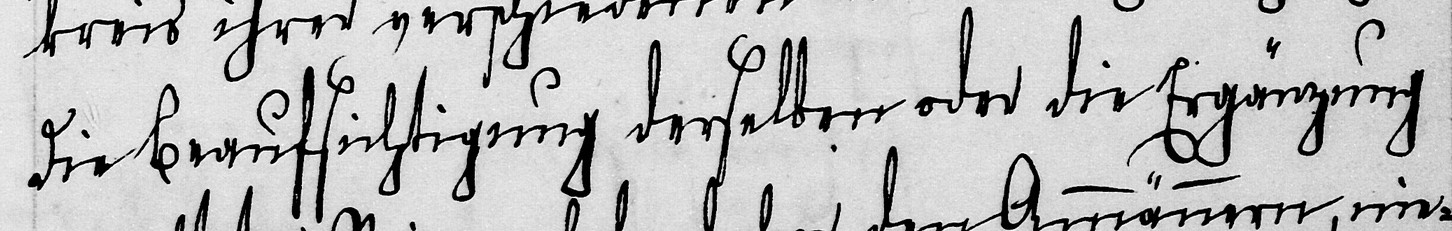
Die Beaufsichtigung derselben oder die Ergänzung
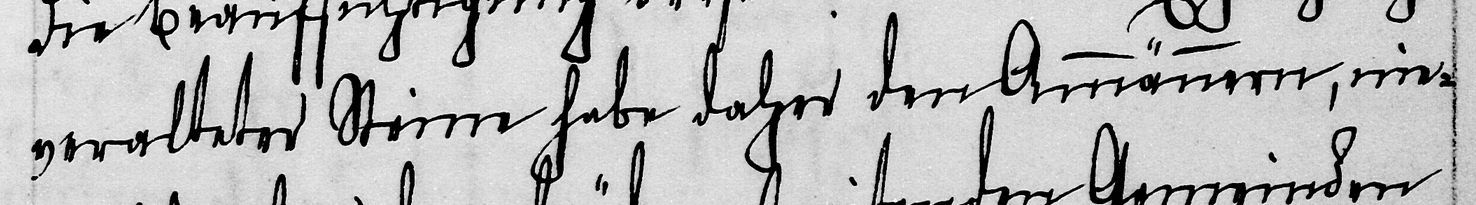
veralteter Steine habe daher den Ammännern, nie¬
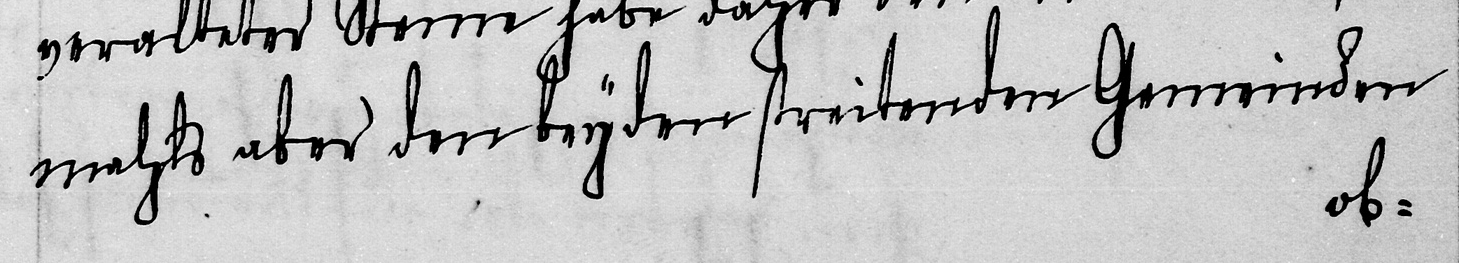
mahls aber den beyden streitenden Gemeinden
